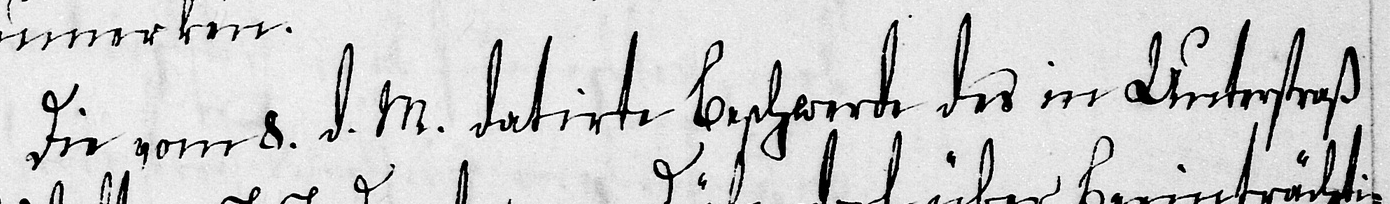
Die vom 8. d. M. datirte Beschwerde des in Unterstraß
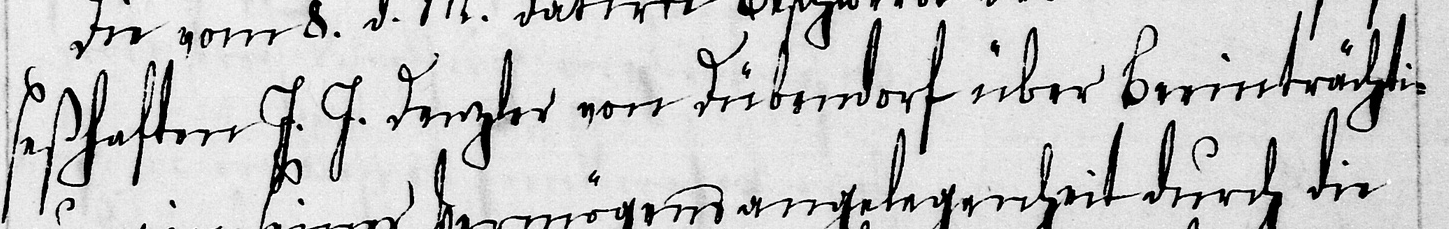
seßhaften J. J. Denzler von Dübendorf über Beeinträchti¬
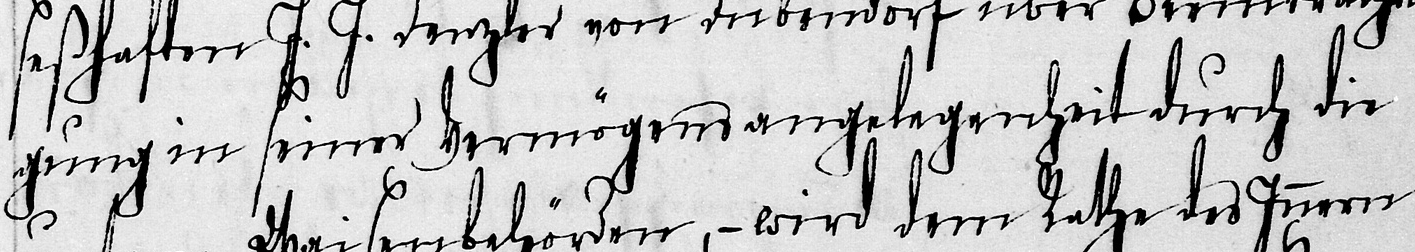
gung in seiner Vermögensangelegenheit durch die
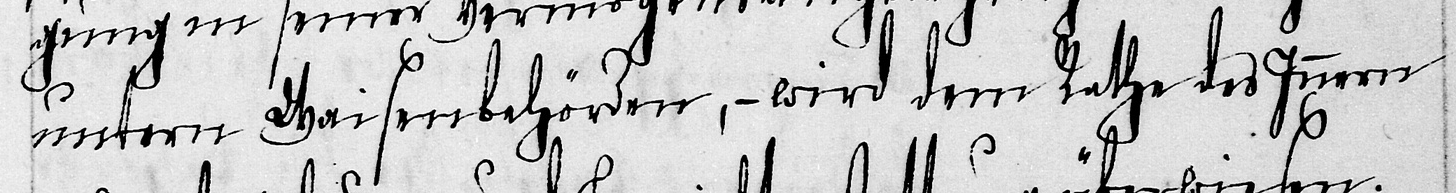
untern Waisenbehörden, – wird dem Rathe des Innern
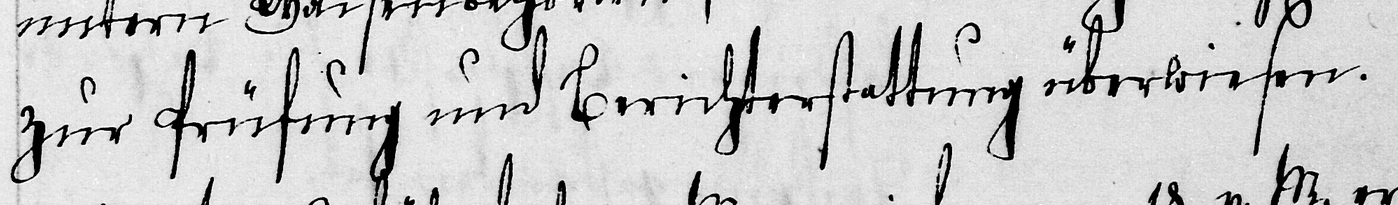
zur Prüfung und Berichterstattung überwiesen.
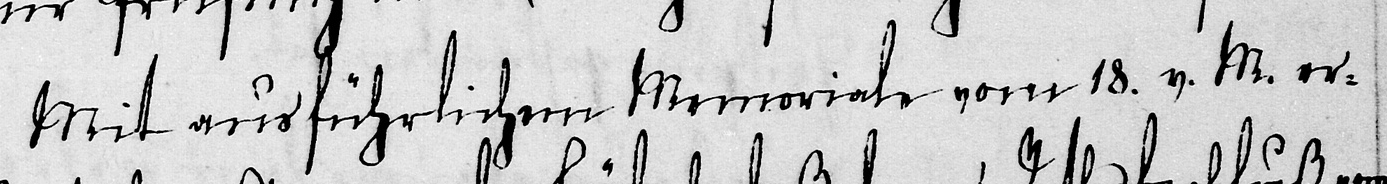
Mit ausführlichem Memoriale vom 18. v. M. er¬
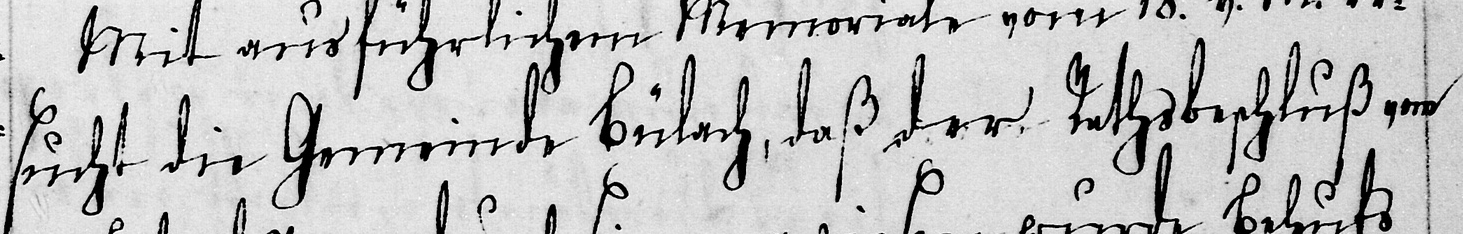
sucht die Gemeinde Bülach, daß der Rathsbeschluß vom
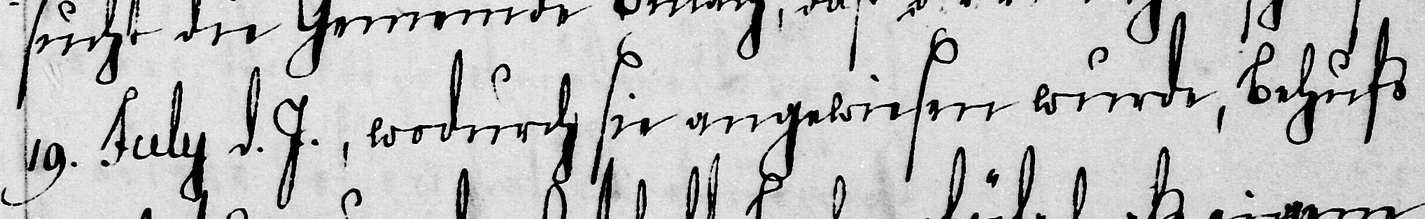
19. July d. J., wodurch sie angewiesen wurde, Behufs
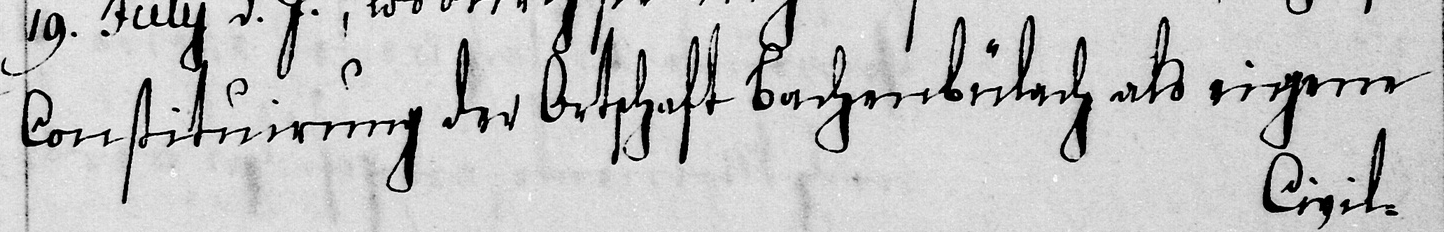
Constituirung der Ortschaft Bachenbülach als eigene
